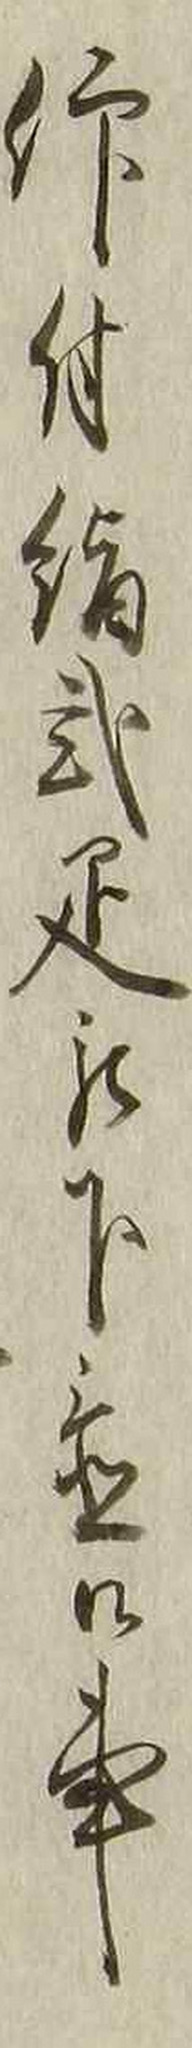仰付絹弐疋被下置候事
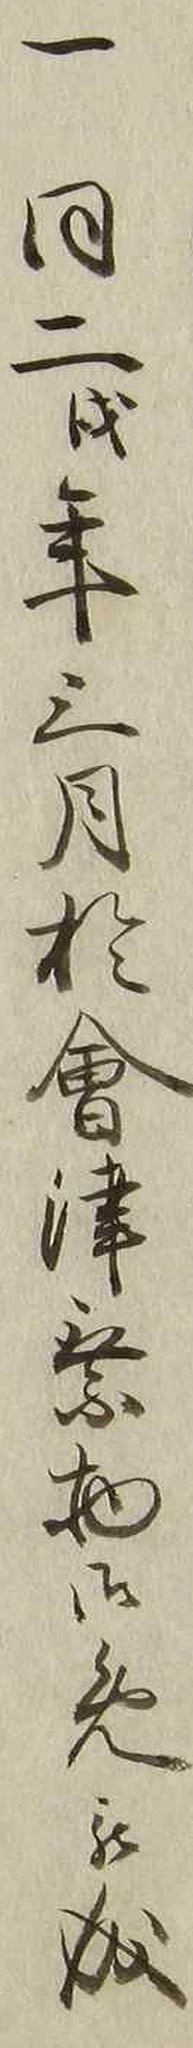一同二戌年三月於会津乗物御免被成
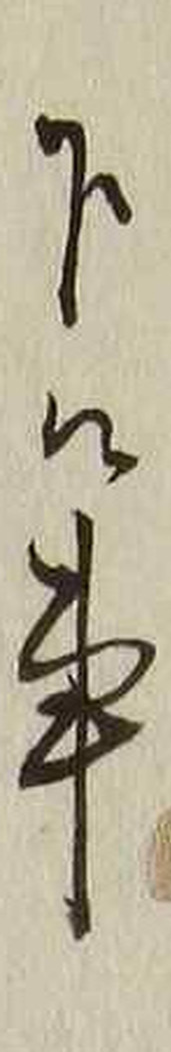下候事
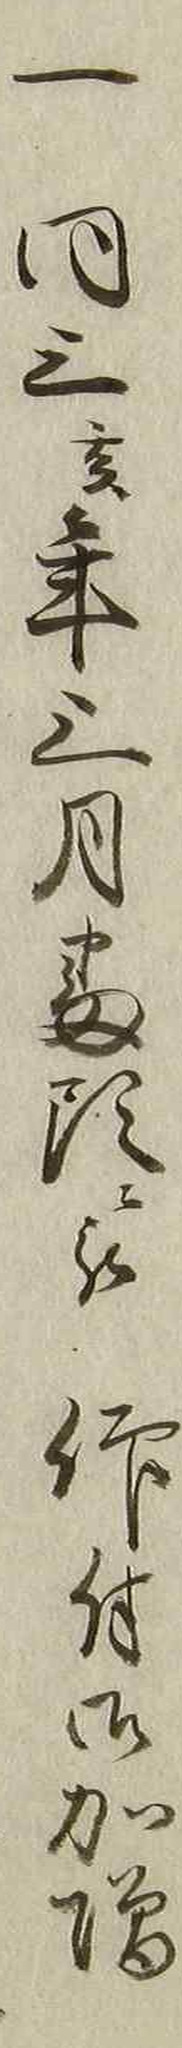一同三亥年三月番頭ニ被仰付御加増
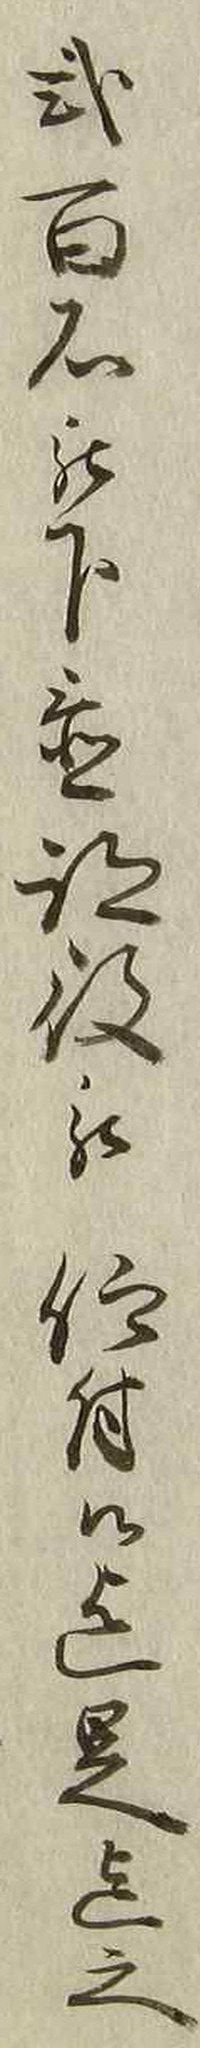弐百石被下置跡役被仰付候迄是迄之
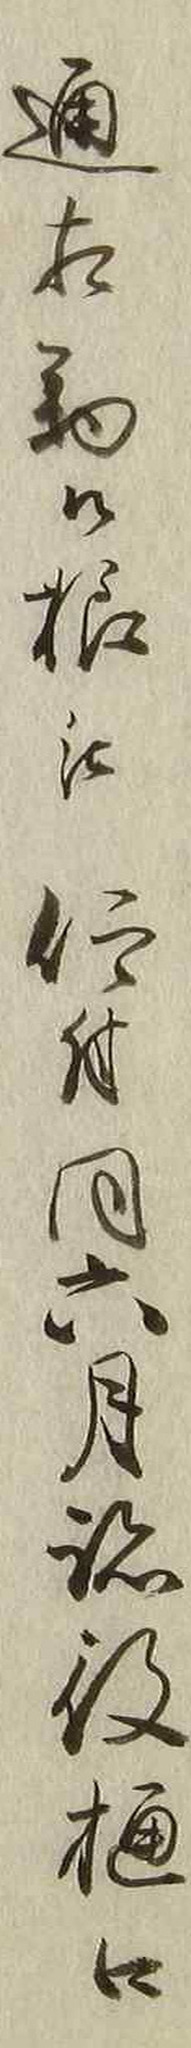通相勤候様被仰付同六月跡役樋口
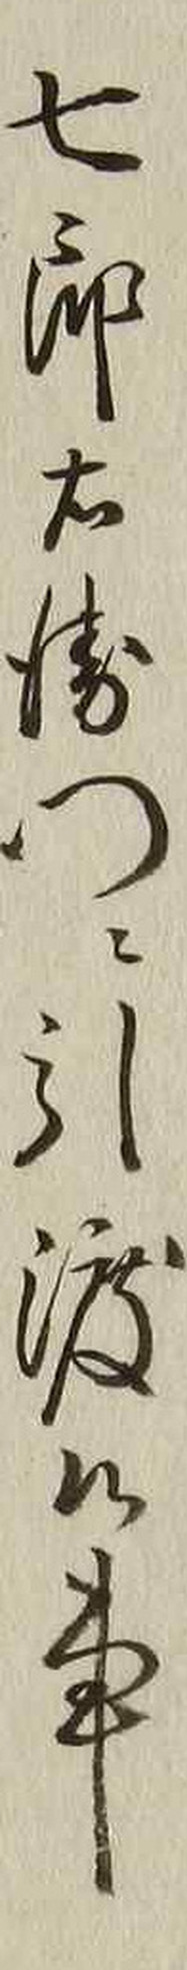七郎右衛門ニ引渡候事
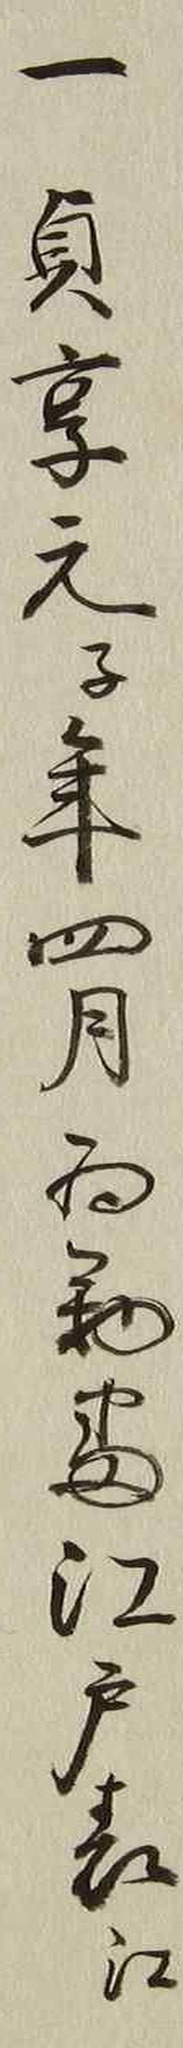一貞享元子年四月為勤番江戸表江
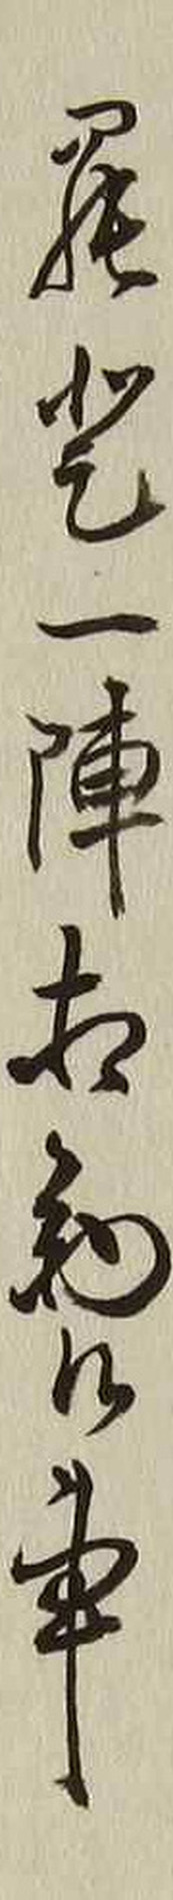罷登一陣相勤候事
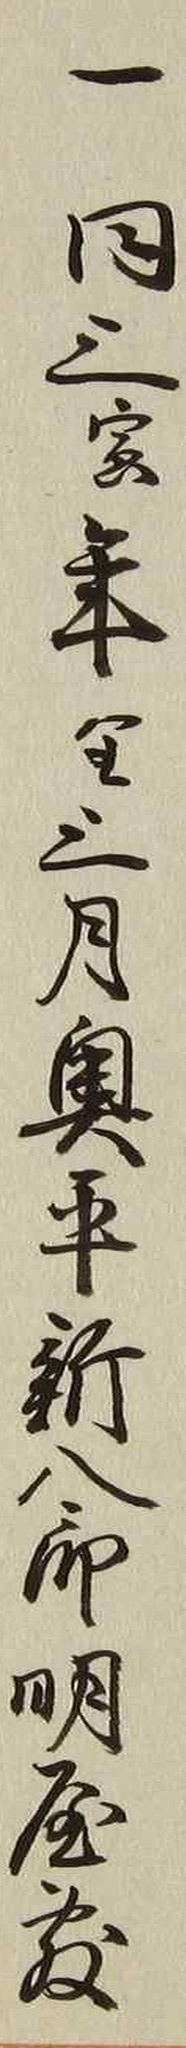一同三寅年閏三月奥平新八郎明屋敷
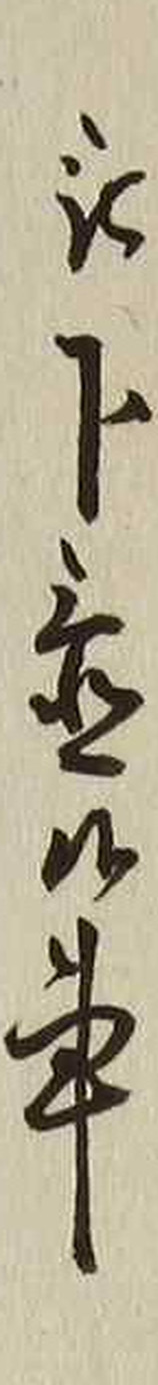被下置候事
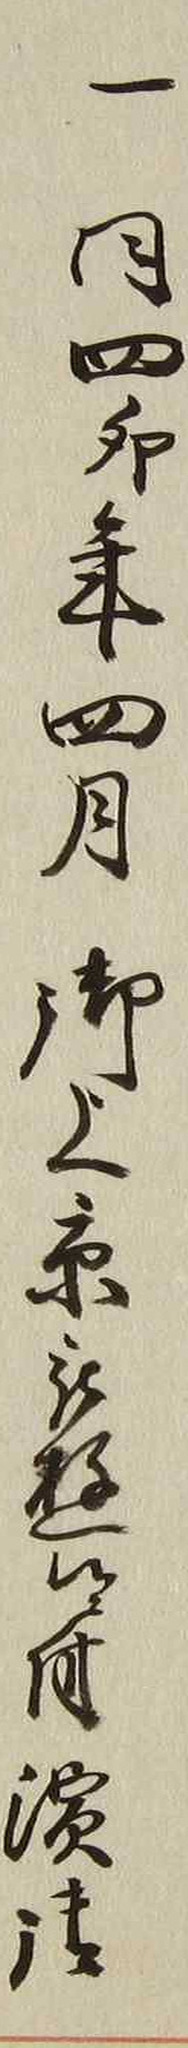一同四卯年四月御上京被遊候ニ付浜御
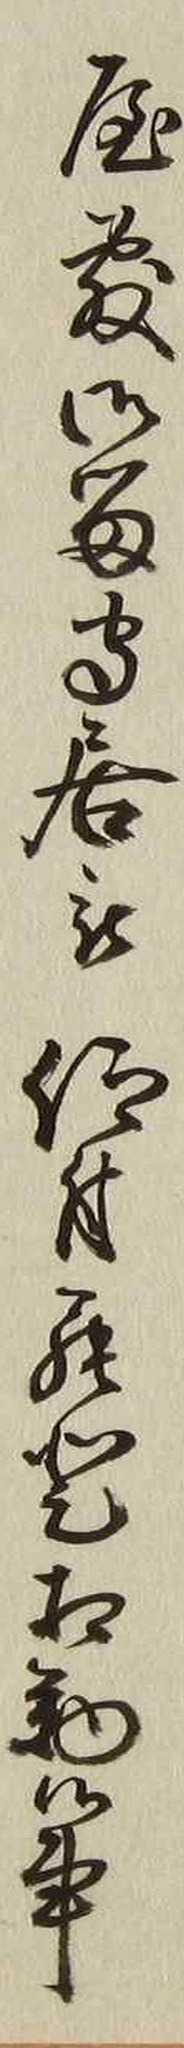屋敷御留守居被仰付罷登相勤候事
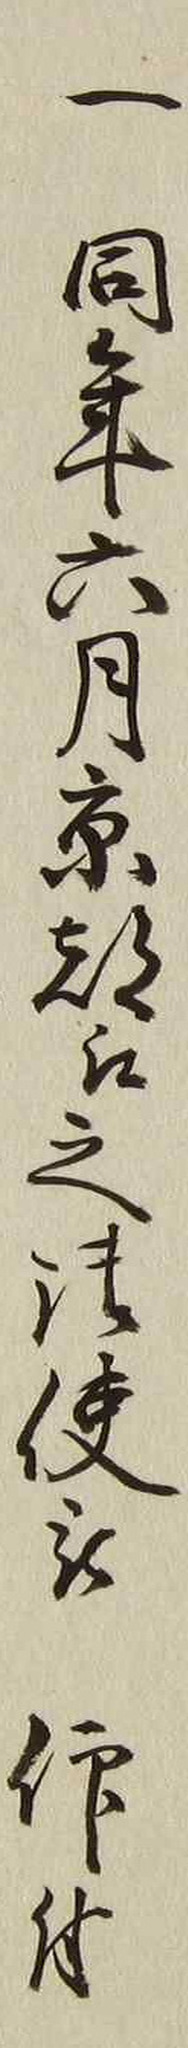一同年六月京都江之御使被仰付
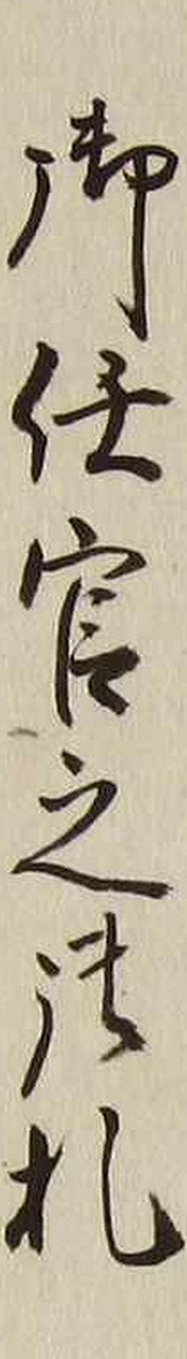御任官之御札
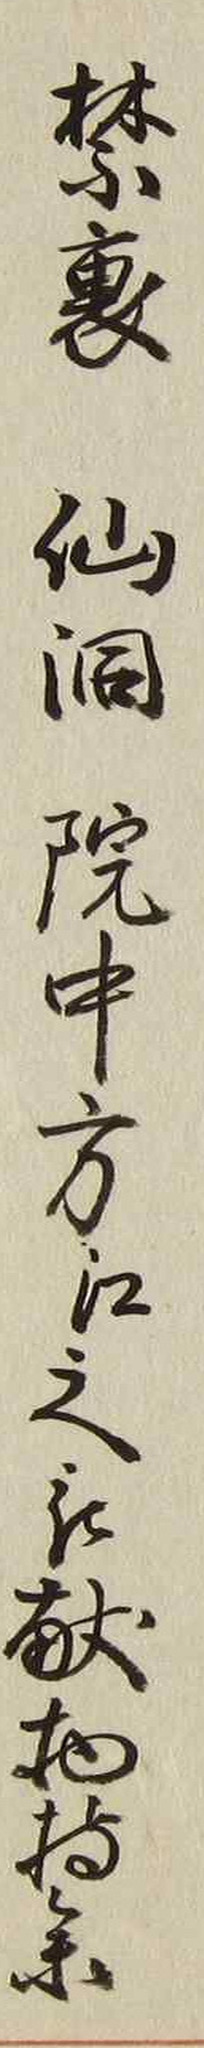禁裏仙洞院中方江之被献物持参
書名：諸士系譜　巻之15　い之部15
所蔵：会津若松市立会津図書館
